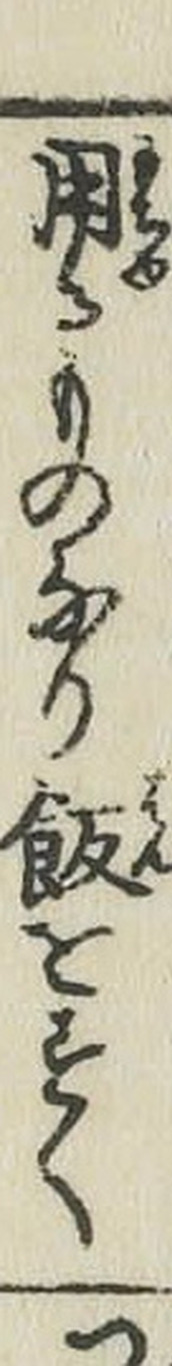用るものなり飯をすく
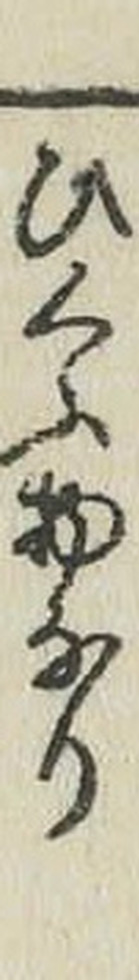ひくふ物なり
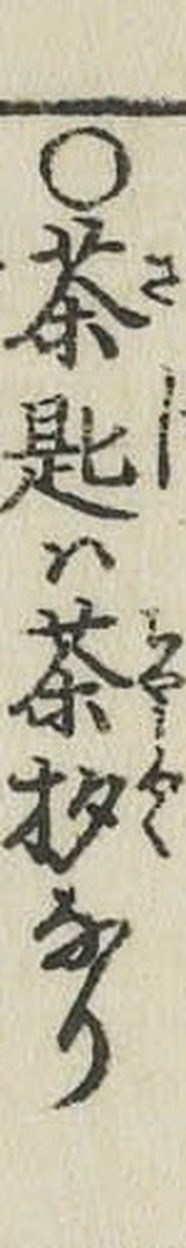○茶匙は茶𣏐なり
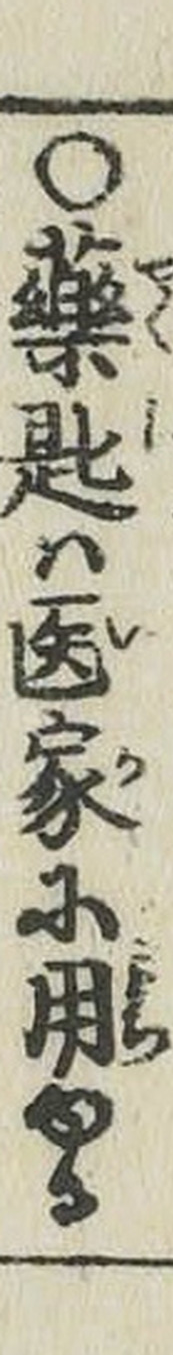○薬匙は医家に用ゆる
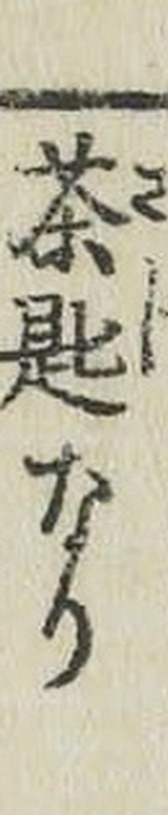茶匙なり
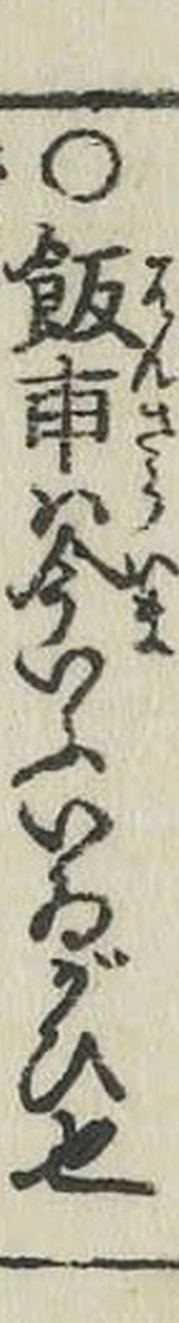○飯𢆍は今いふいゐがひ也
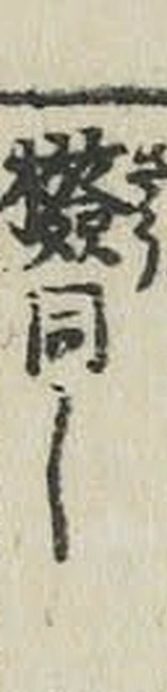𣠺同し

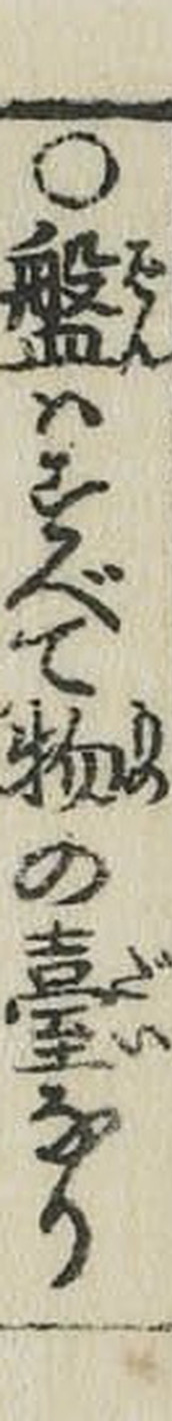○盤はすべて物の台なり
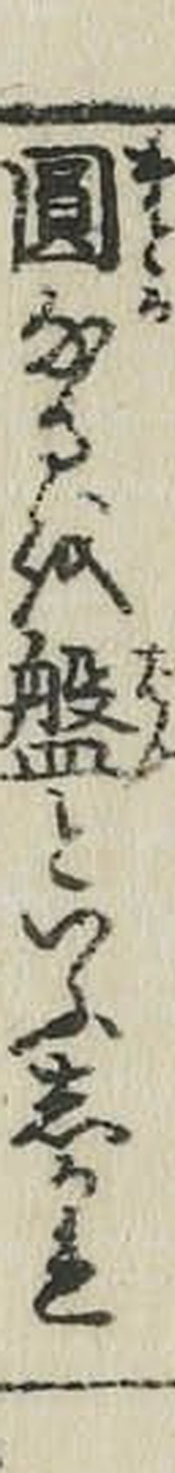円なるを盤といふしかれ
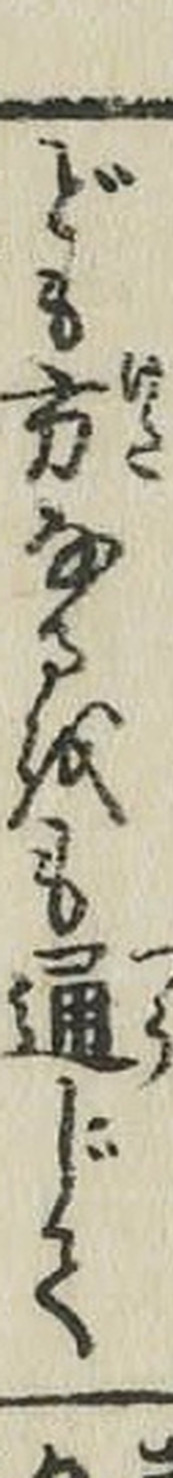ども方なるをも通じて
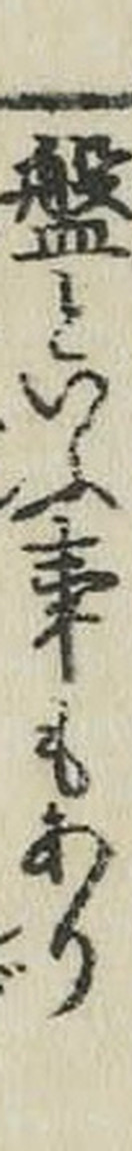盤といふ事もあり
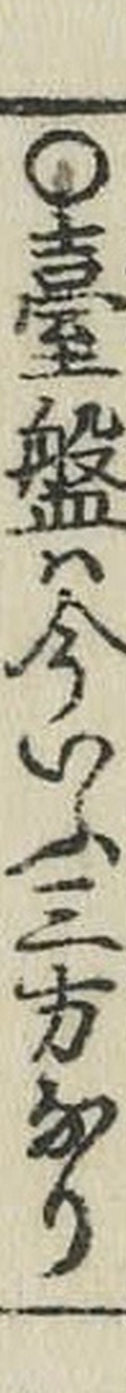○台盤は今いふ三方なり
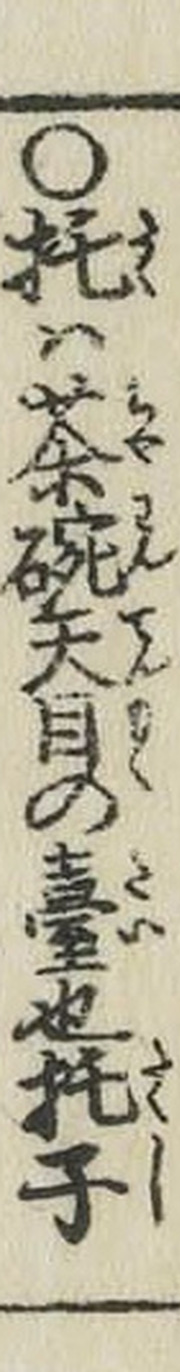○托は茶碗天目の台也托子
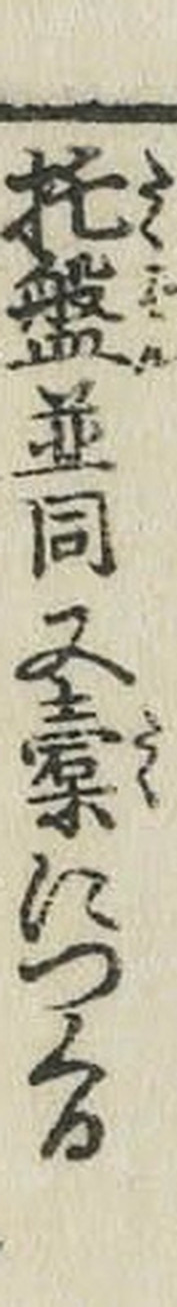托盤並同又槖につくる
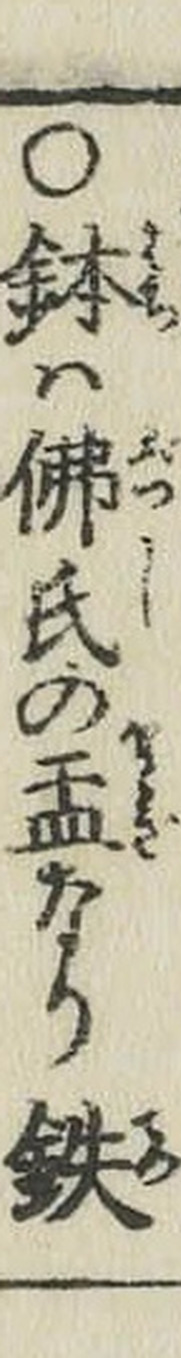○鉢は仏氏の盂なり鉄
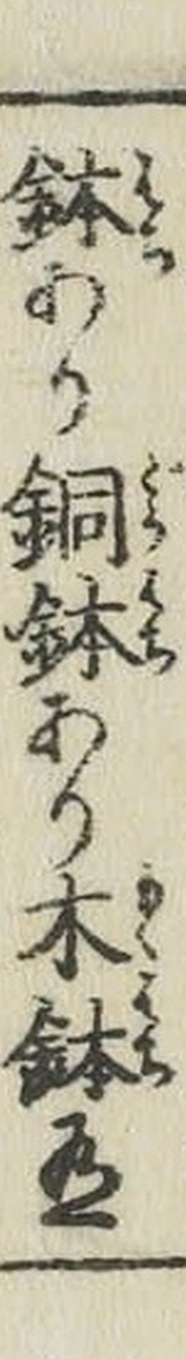鉢あり銅鉢あり木鉢有
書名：増補頭書訓蒙図彙大成 10巻 5:巻之9-11
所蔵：東京学芸大学教育コンテンツアーカイブ
